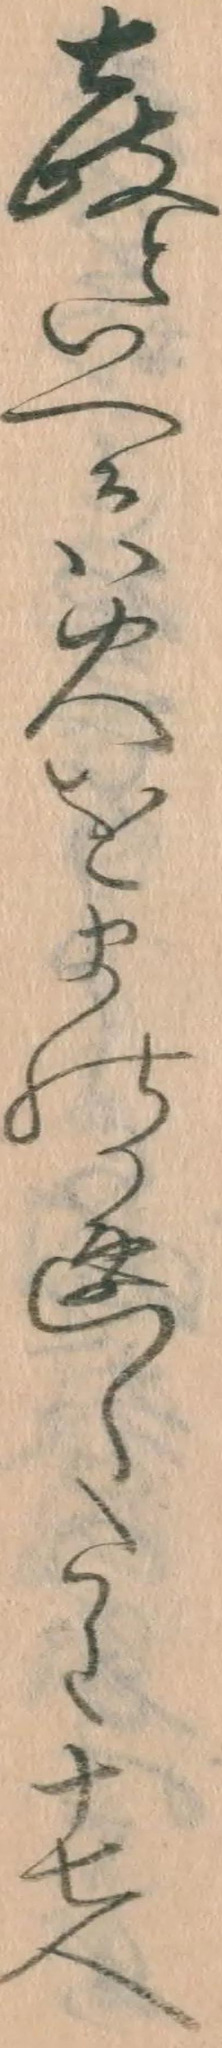土岐といへるハ火をまのかれたりに十七人
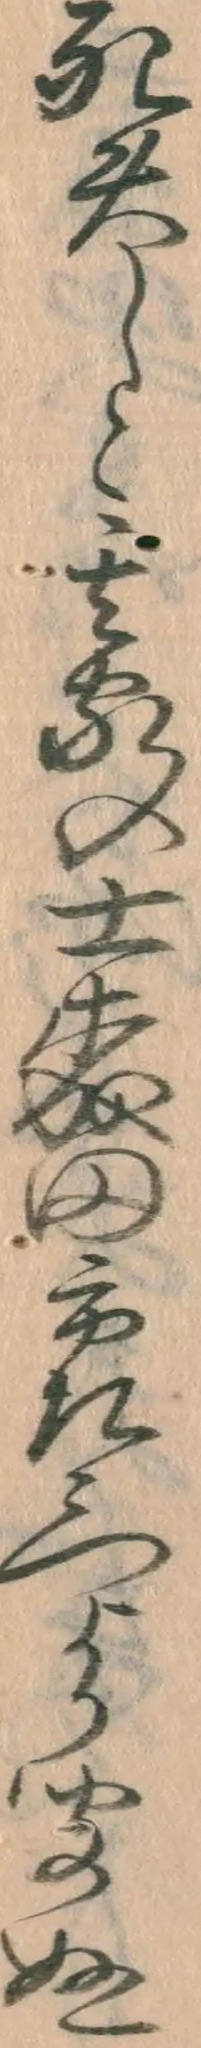死失しと其家の士森田市左衛門より聞ぬ
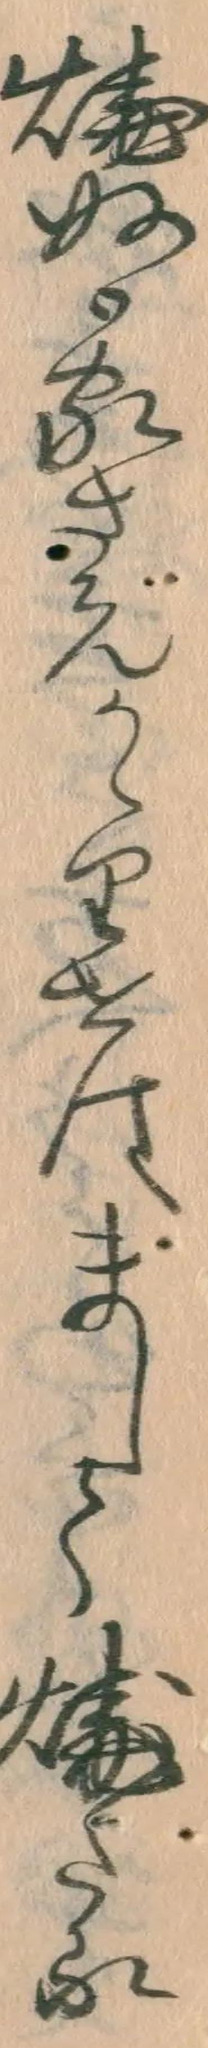燒ぬ御家さらんかヽりせはまして燒たる
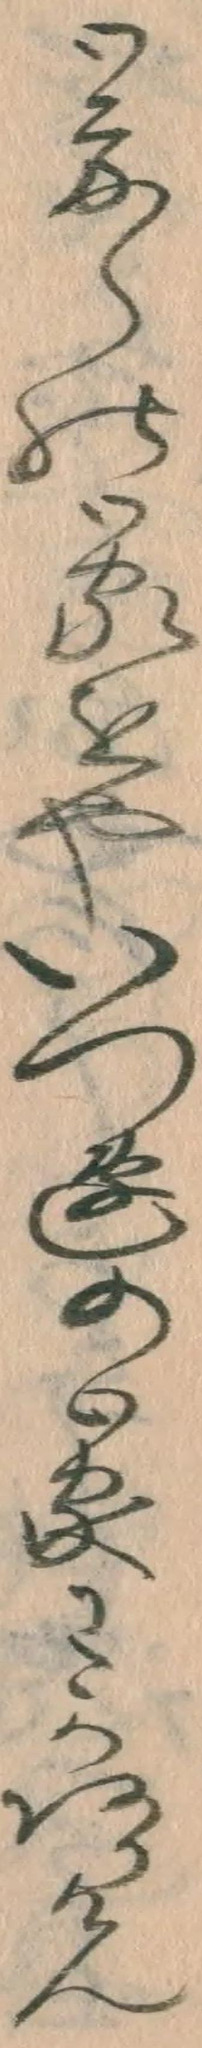御方ゝの御家をやいつれの御家にかありけん
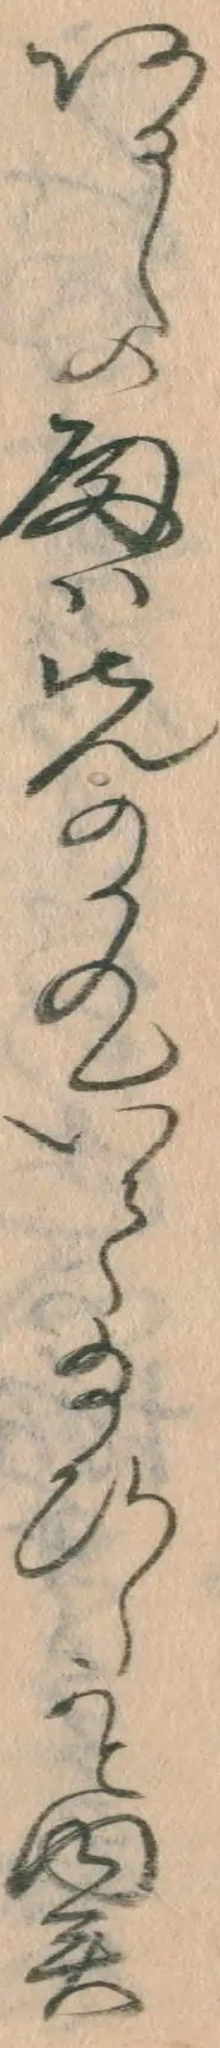あるしの殿ハ先のかれいて玉ひしかと内君
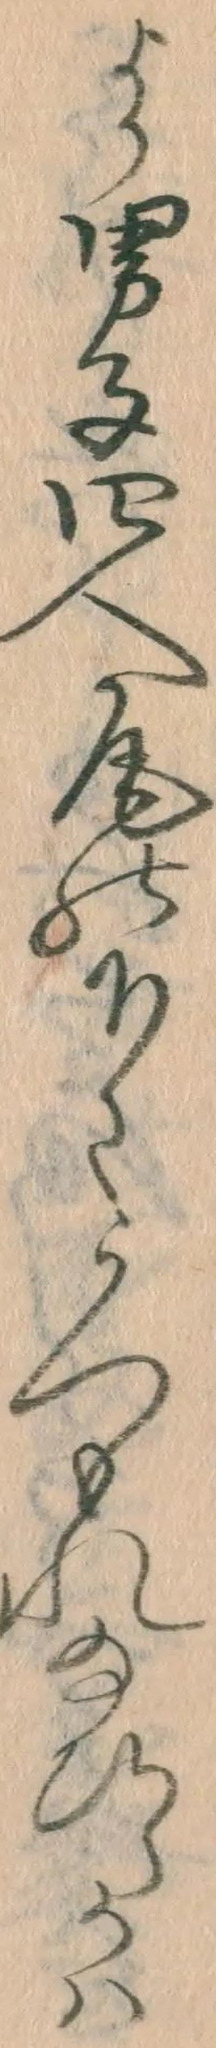より男子四人瓦の下にうつもれ玉ひしかハ
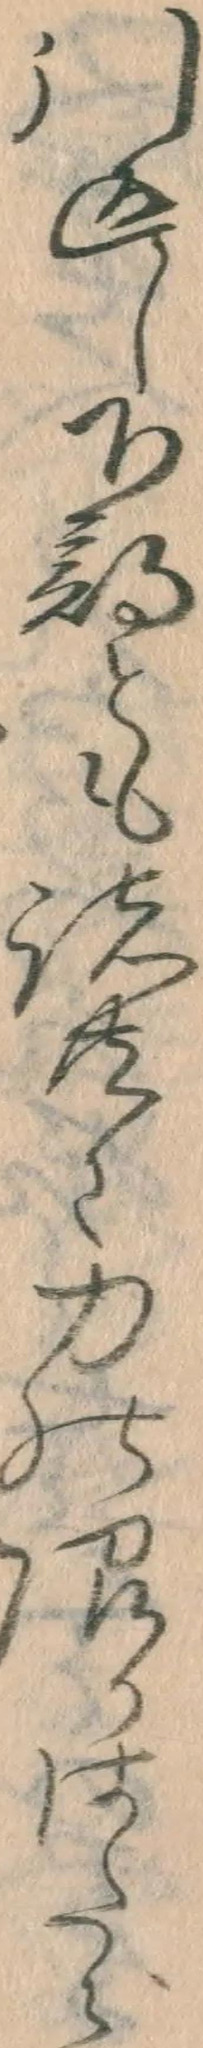引返し下部とも諸共に力の限りはたら
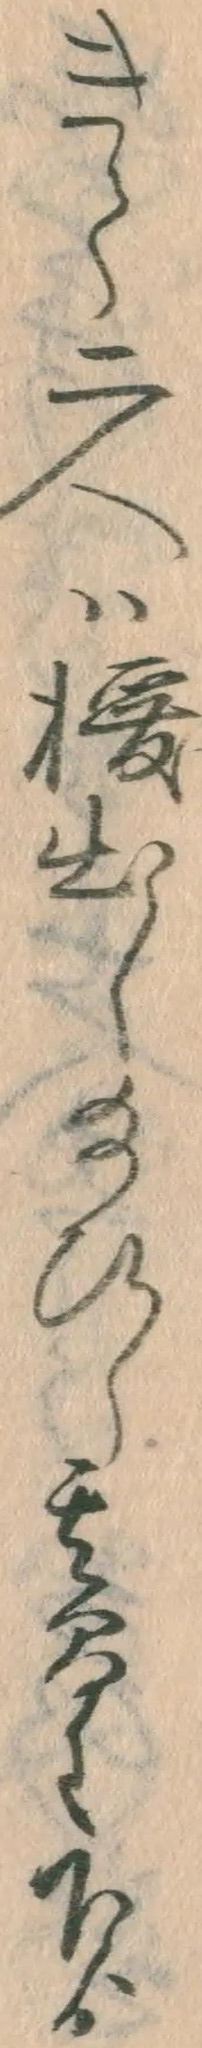きて二人ハ援出し玉ひし其間に下ゟ
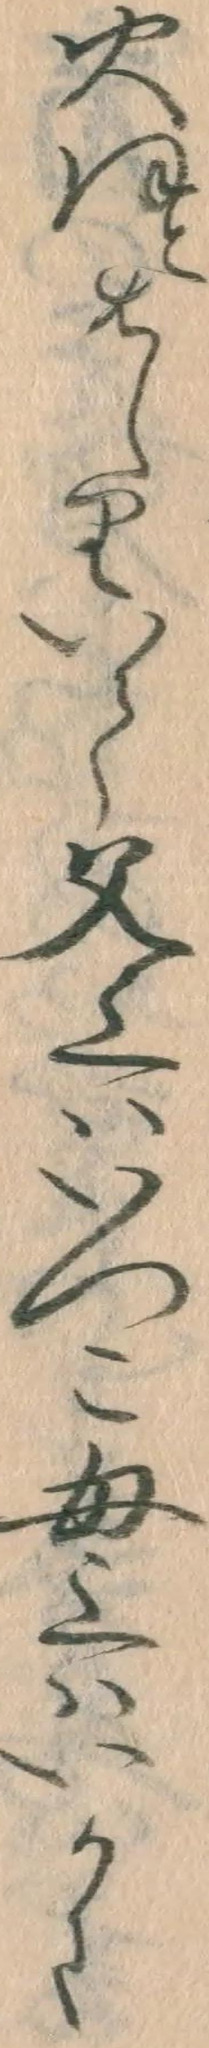火ほとはしりいて父上ハいつこ母上ハいかに
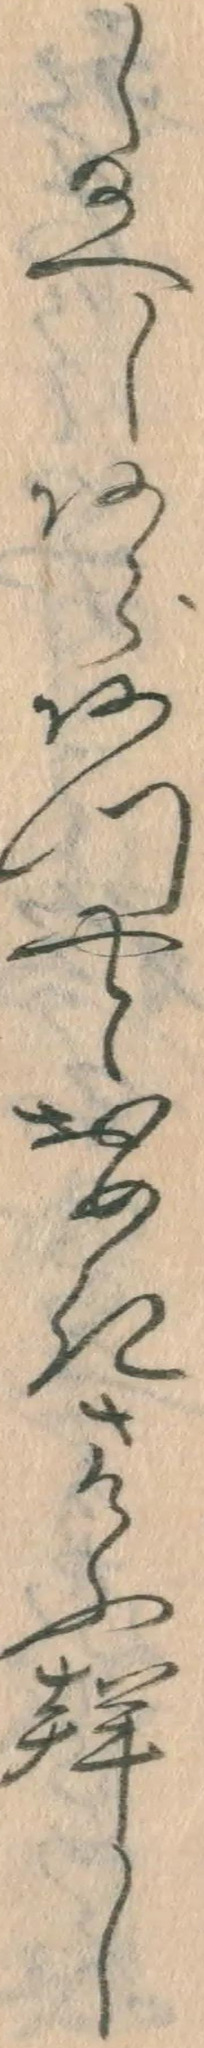し玉へしあらあつやとおめきさけふ聲し
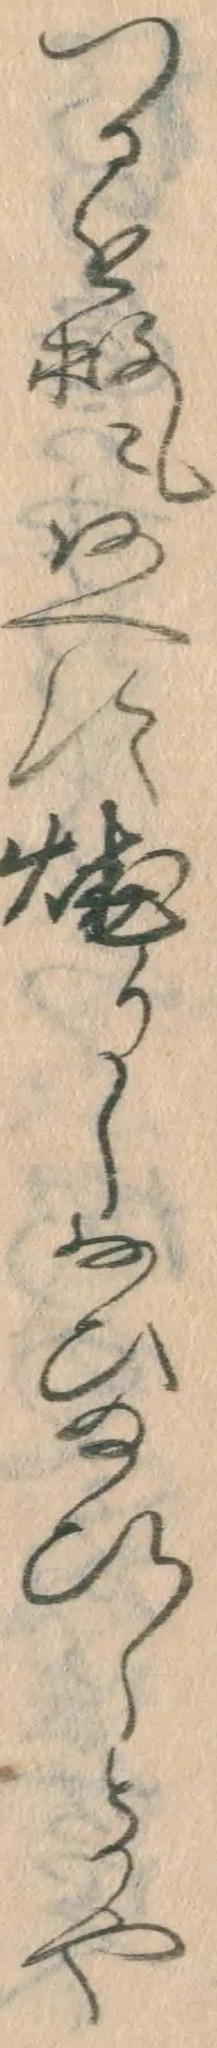つるを救もあへす燒りしなひ玉ひしとかや
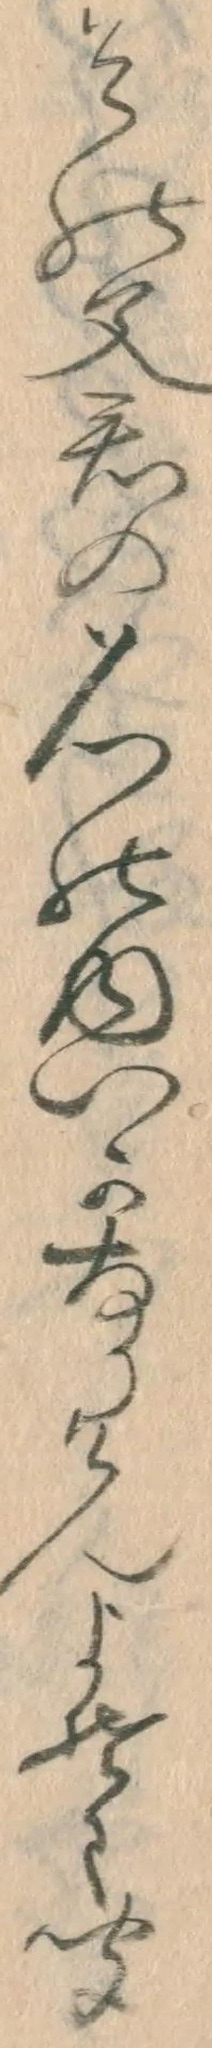その父君の御心の内いかなりけんよそに聞
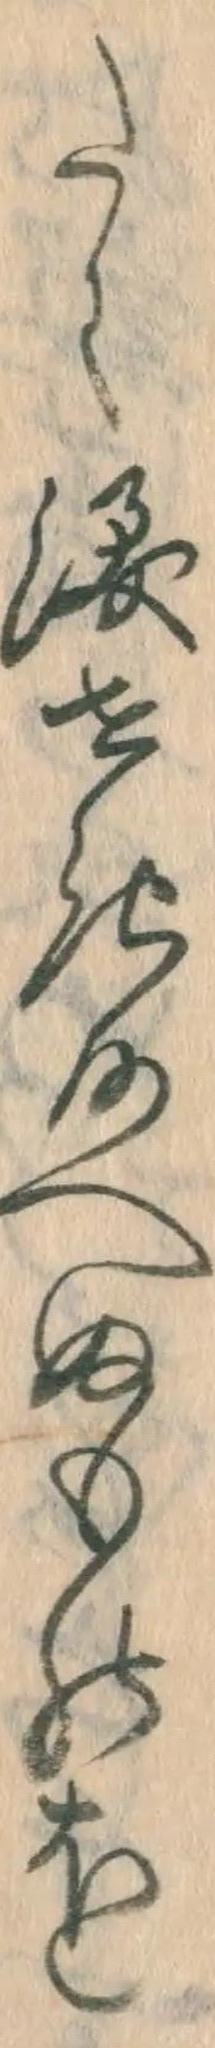たに涙せきあへぬものを
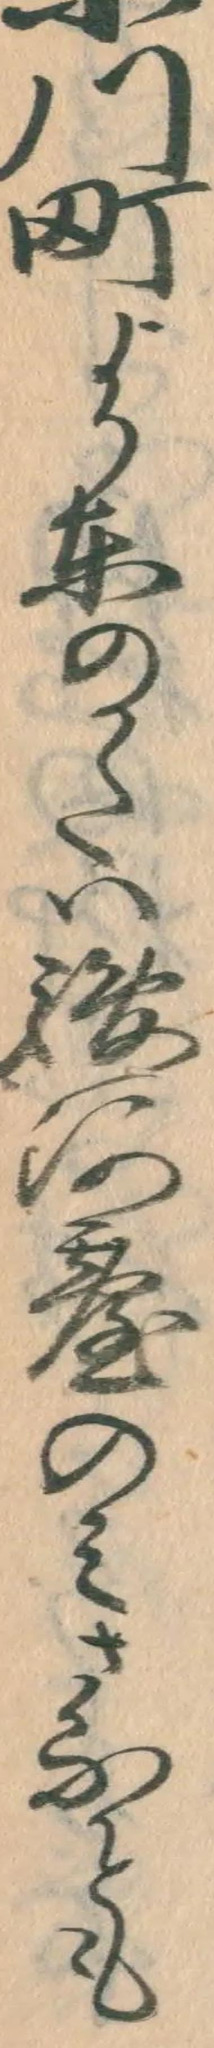小川町より東のかたハ駿河臺のミさるとも

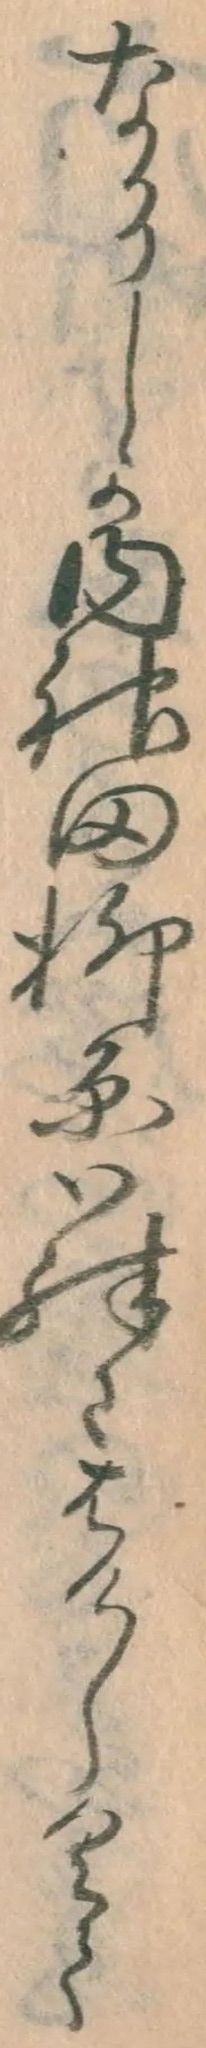なかりしか内神田柳原ハ殊にはけしくて
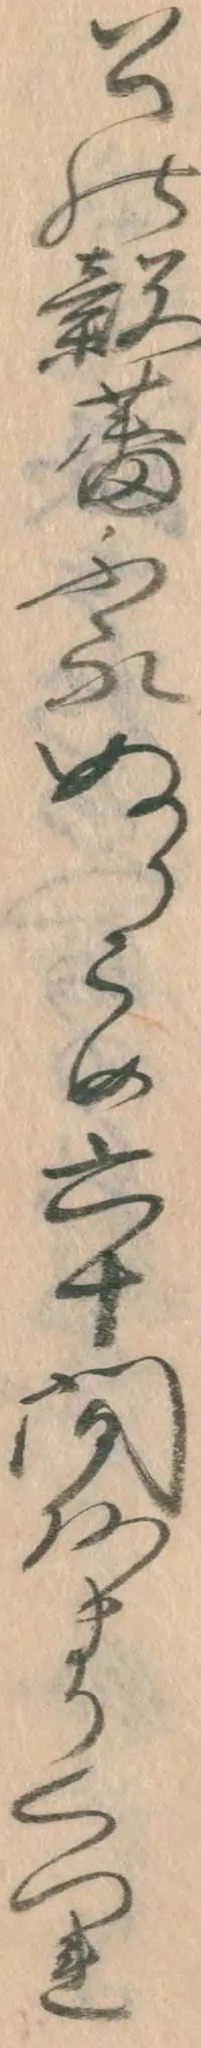公の穀番ふるぬりこめ六十間あまりくつれ
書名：麗斎叢書. 20
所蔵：国立国会図書館 National Diet Library, JAPAN
